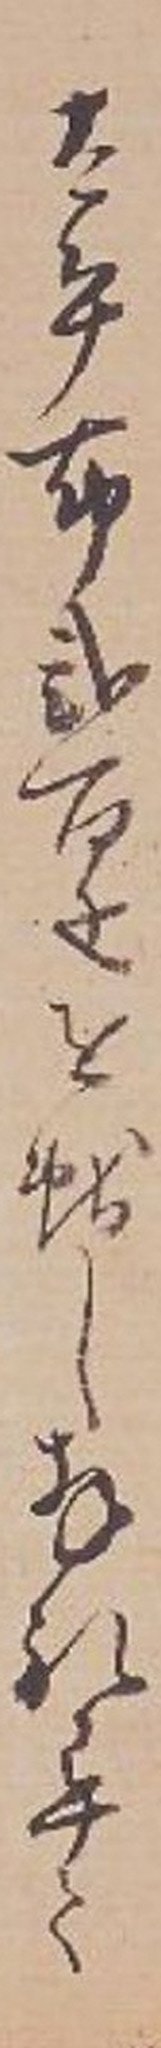太平布二百疋を献し拝礼畢て
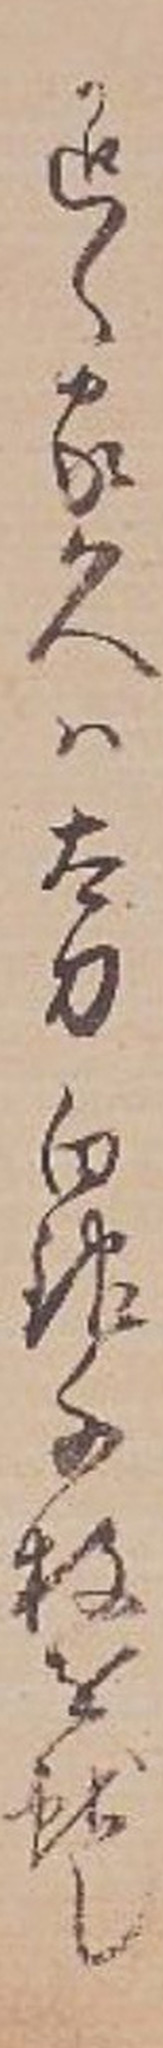退く家久ハ太刀白銀千枚を献し
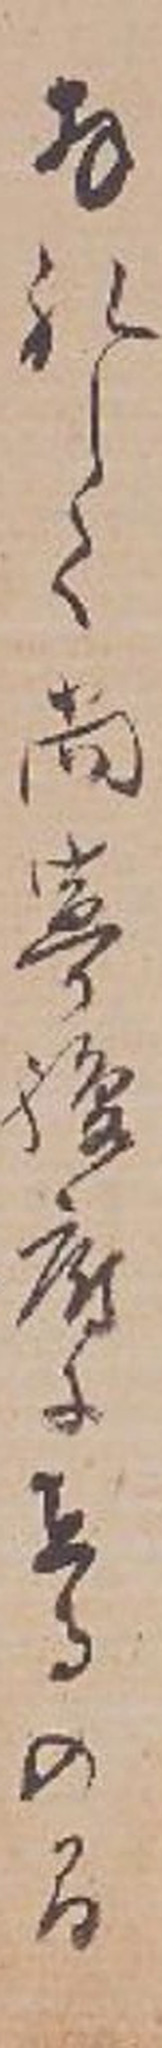拝礼して尚寧駿府に有るの間

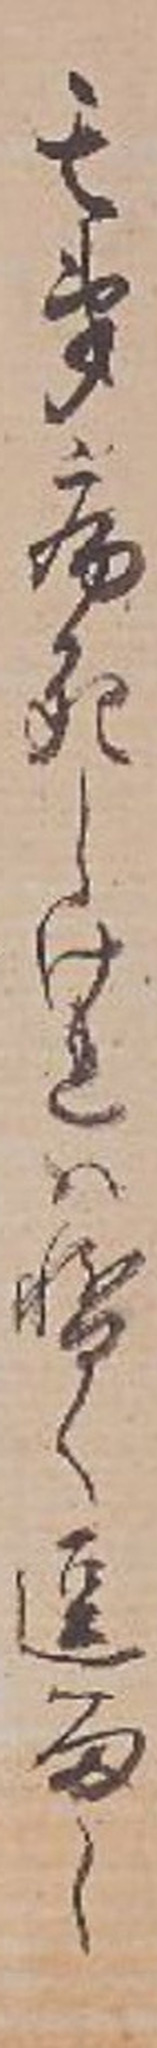其弟病死しけれハ暫く逗留し
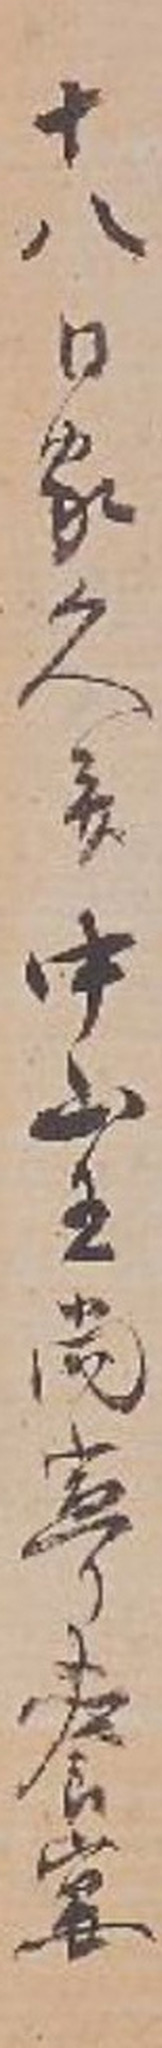十八日家久幷中山王尚寧に饗宴
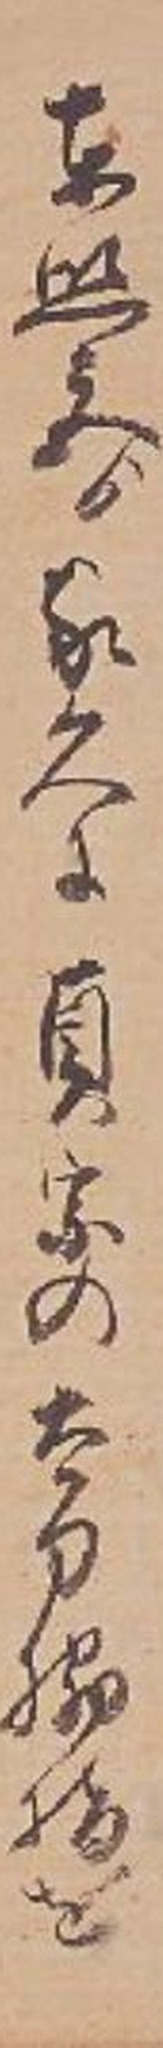東照宮ゟ家久に貞宗の太刀脇指を
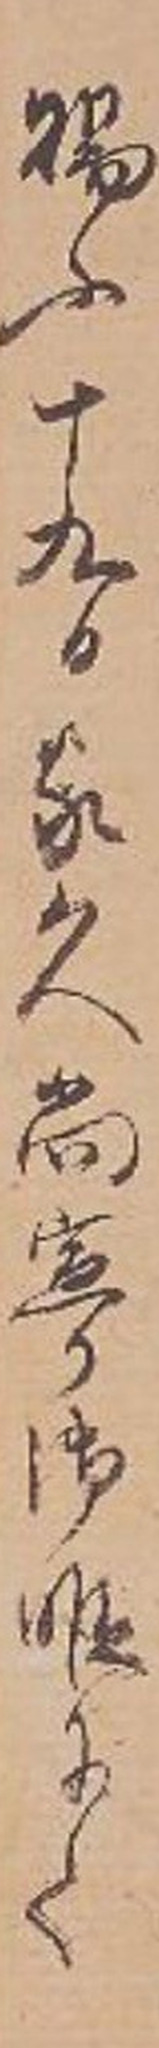賜ふ十九日家久尚寧御暇にて
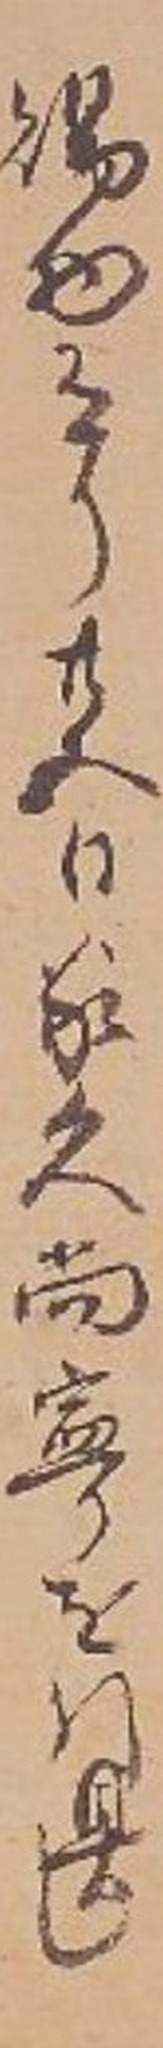賜物有り廿五日家久尚寧を引具し
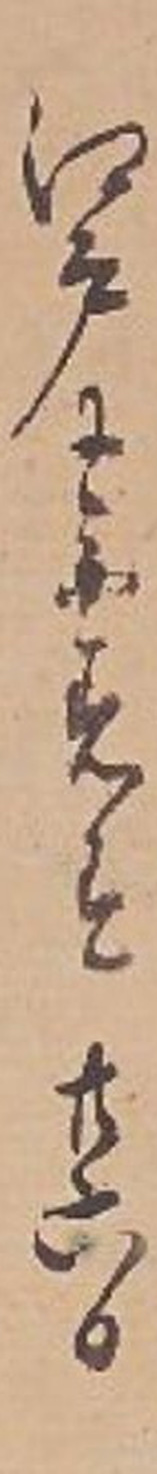江戸に参着す廿六日
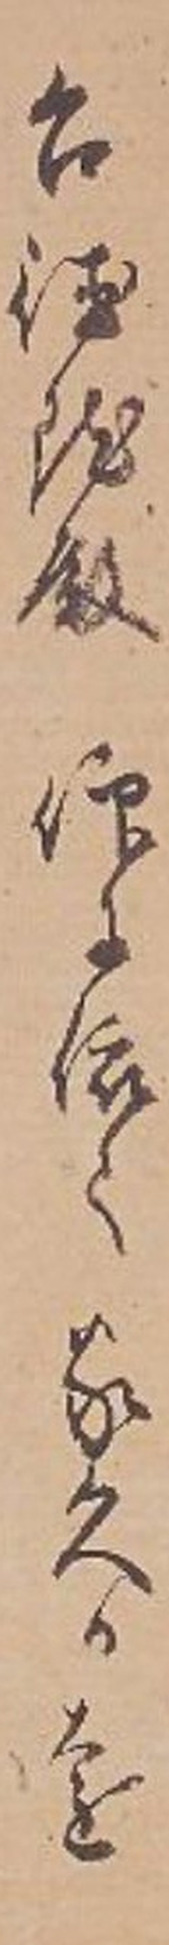台徳院殿仰に依て家久か遠
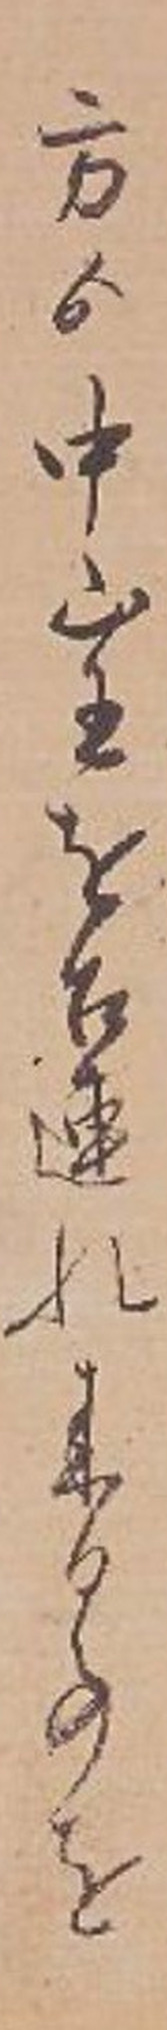方ゟ中山王を召連れ来る事を
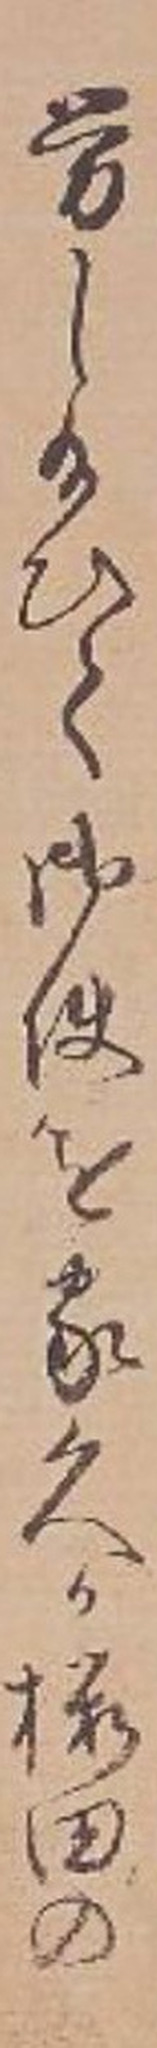労し給ひて御使を家久か桜田の
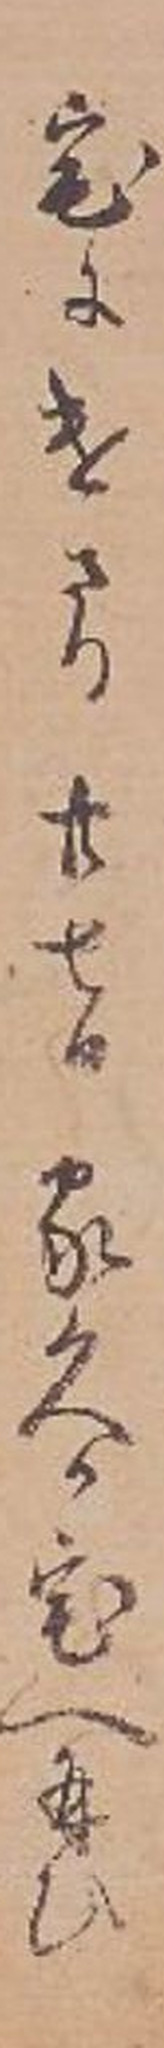宅に遣さる廿七日家久か宅へ再ひ

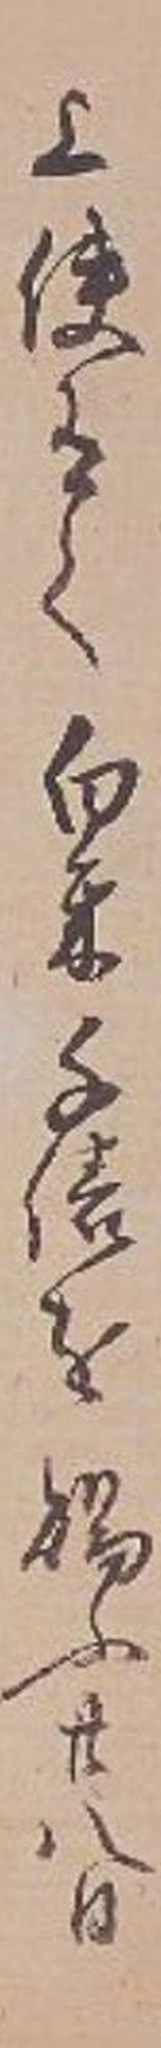上使有て白米千俵を給ふ廿八日
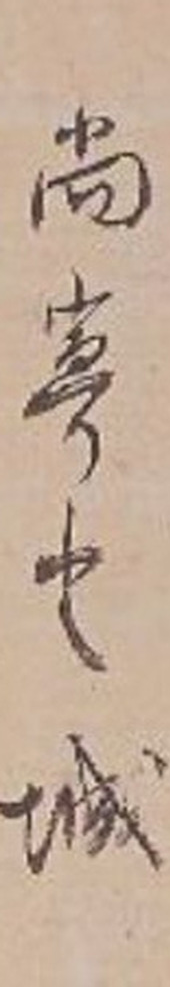尚寧登城
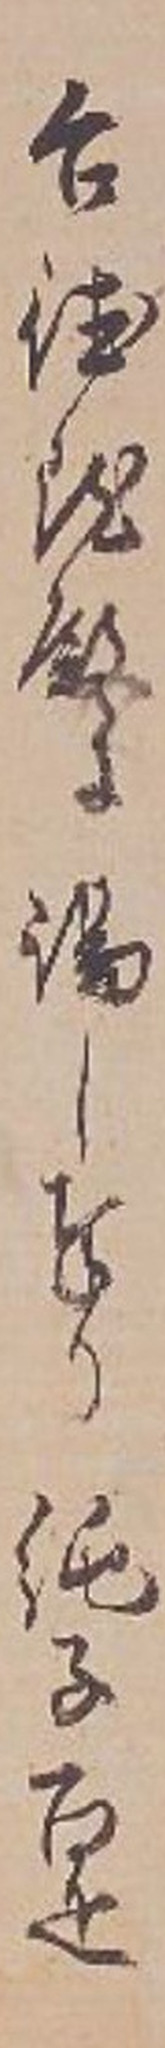台徳院殿に謁し奉り鈍子百疋
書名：琉球人来朝記 一、二
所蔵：University of the Ryukyus Library
